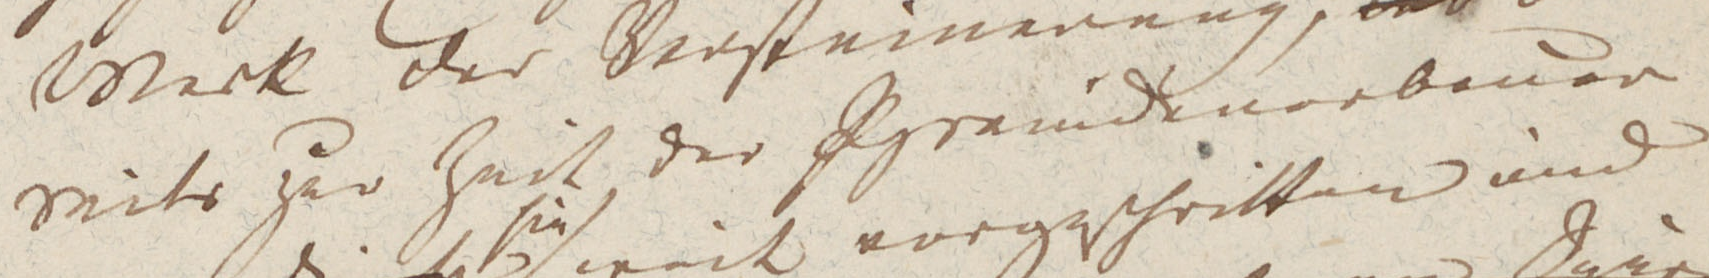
reits zur Zeit der Pyramidenerbauer
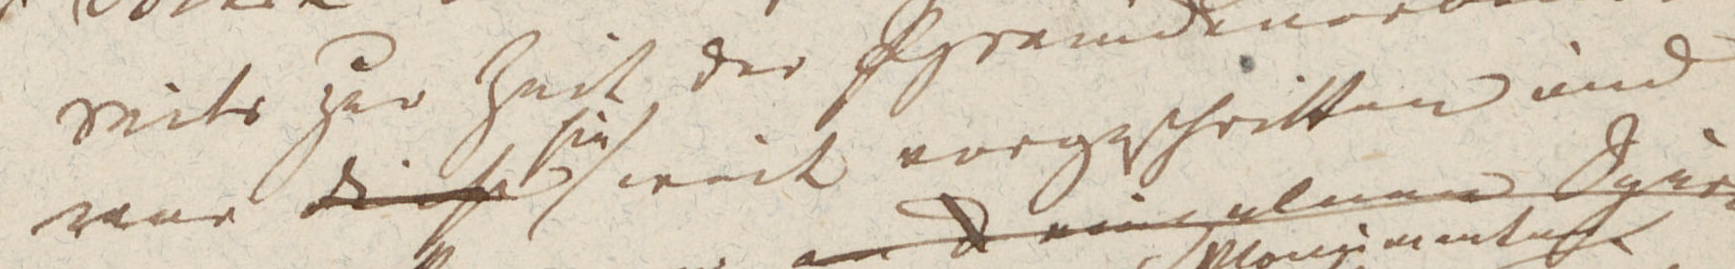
war diese sie weit vorgeschritten und
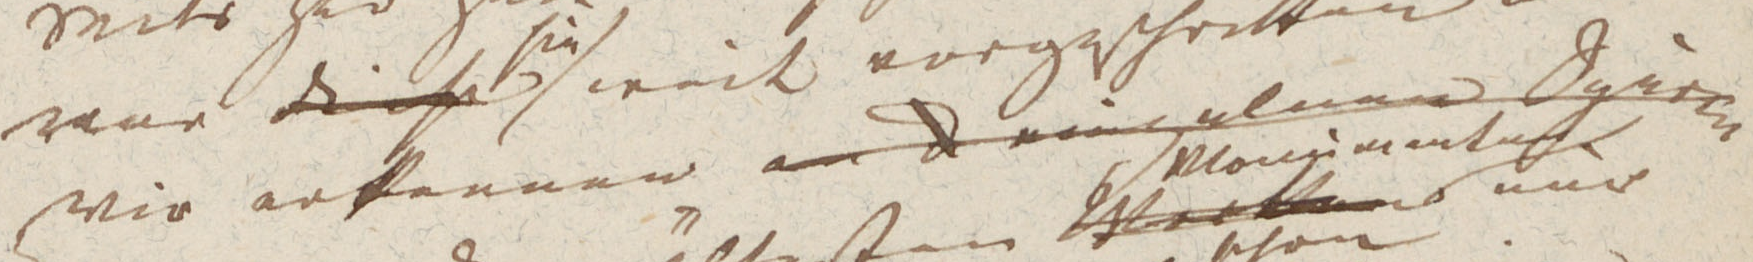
wir erkennen an d einzelnen Spuren
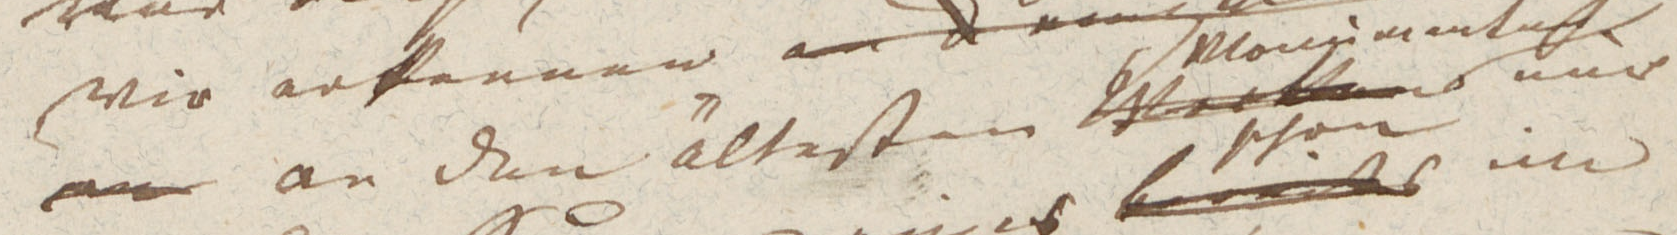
an an den ältesten Werken Monumenten nur
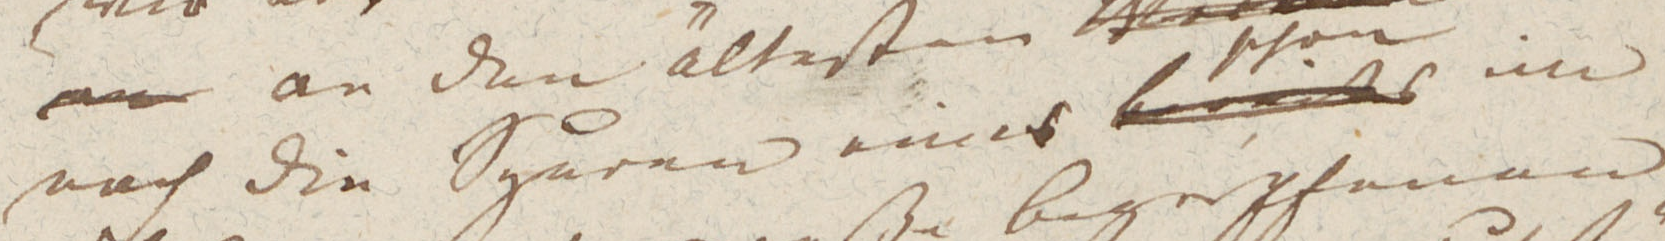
noch die Spuren einesr bereits schon im
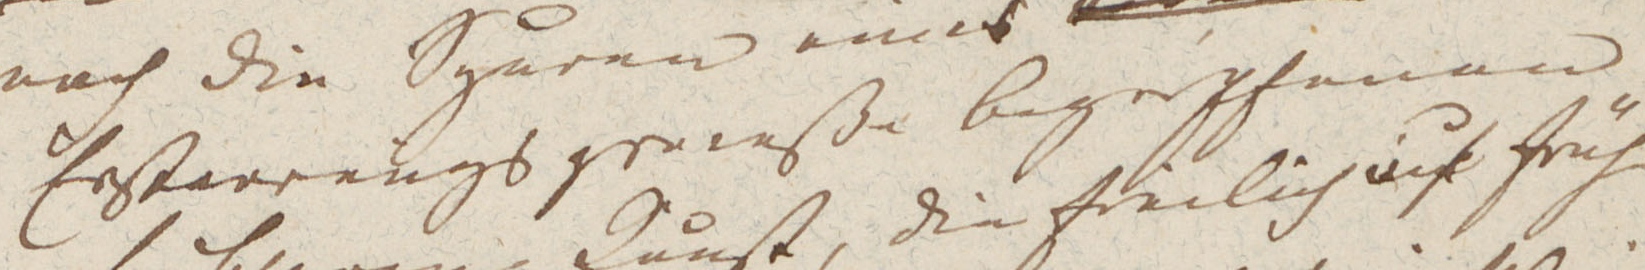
Erstarrungsprocesse begriffenen
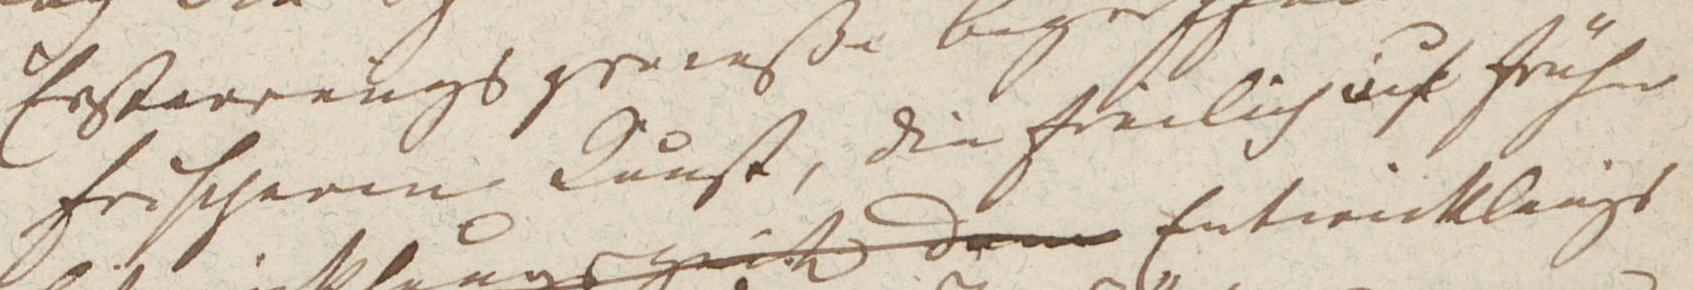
frischeren Kunst, die freilich inauf früher
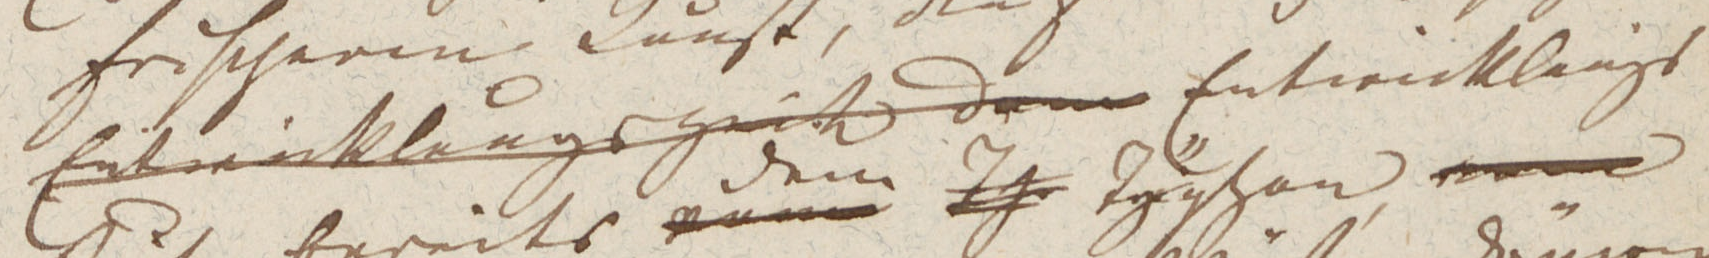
Entwicklungszeit dem Entwicklungs
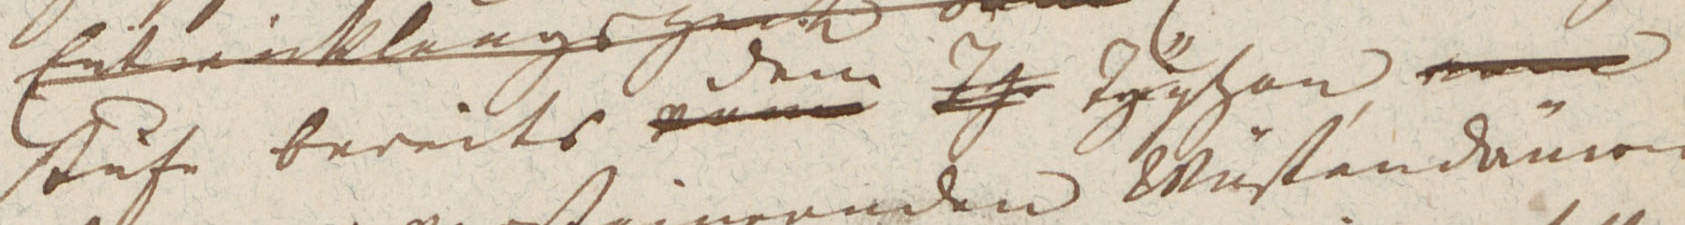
stufe bereits vom dem Th Typhon, vom
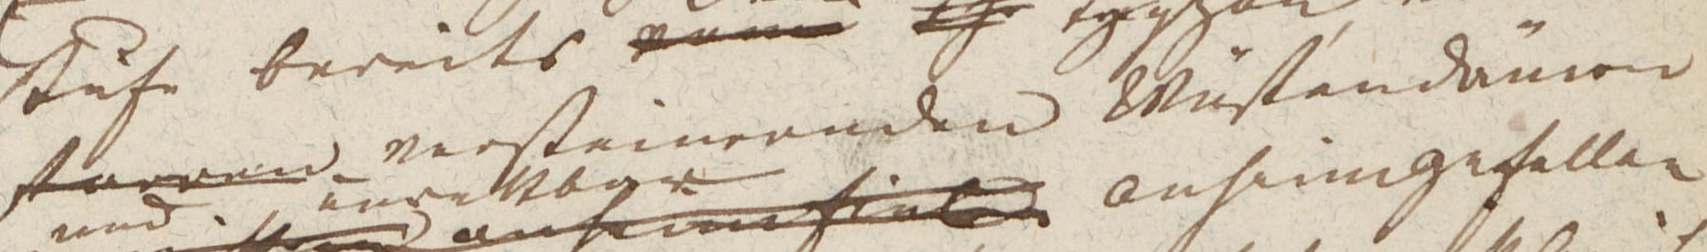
starren versteinernden Wüstendämon
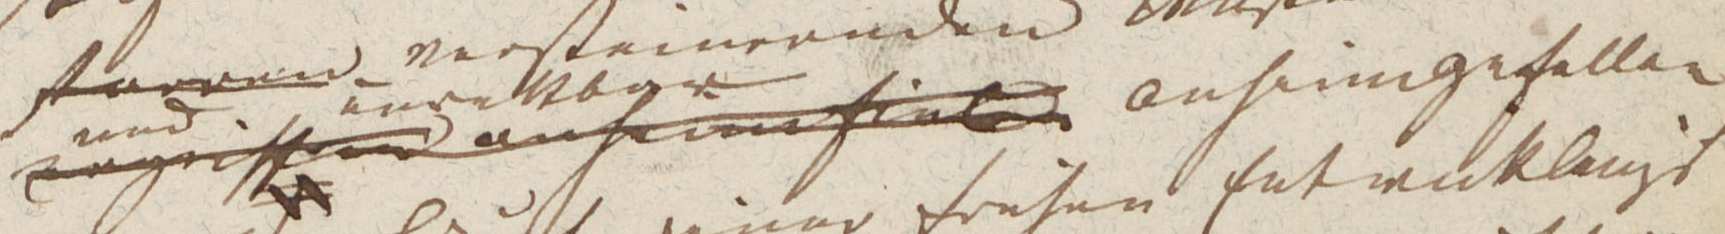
ergriffen anheimfiel und unrettbar anheimgefallen
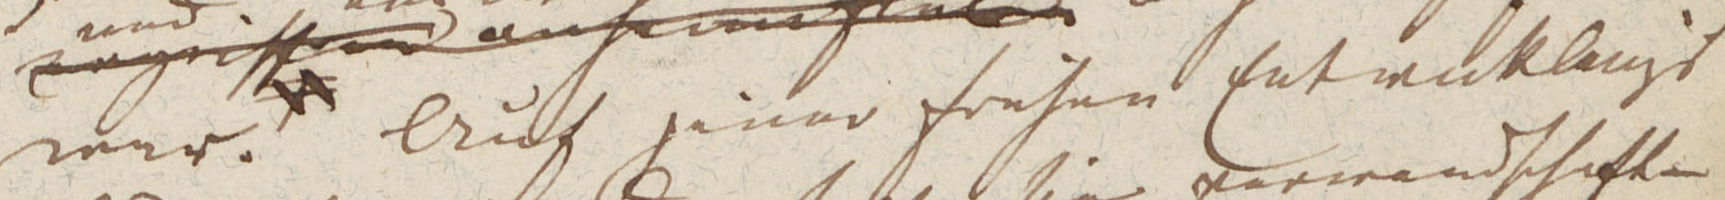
war. % Auf jener frühen Entwicklungs
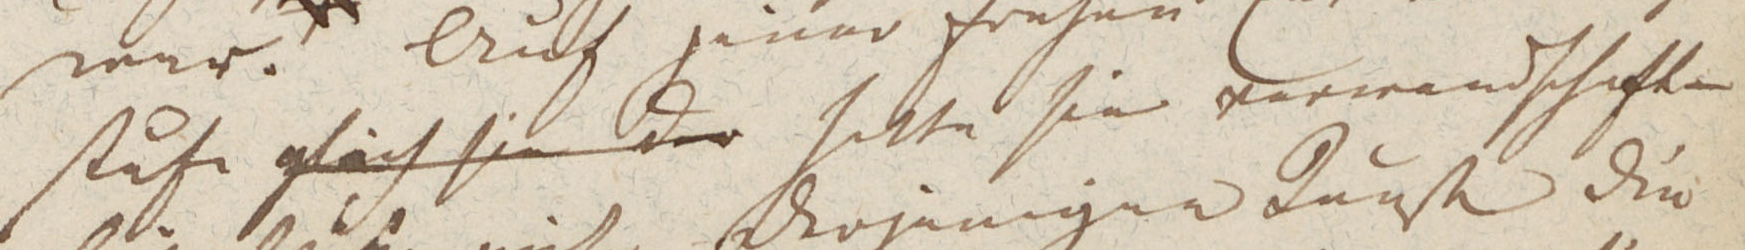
stufe glich sie der hatte sie verwandschaft-
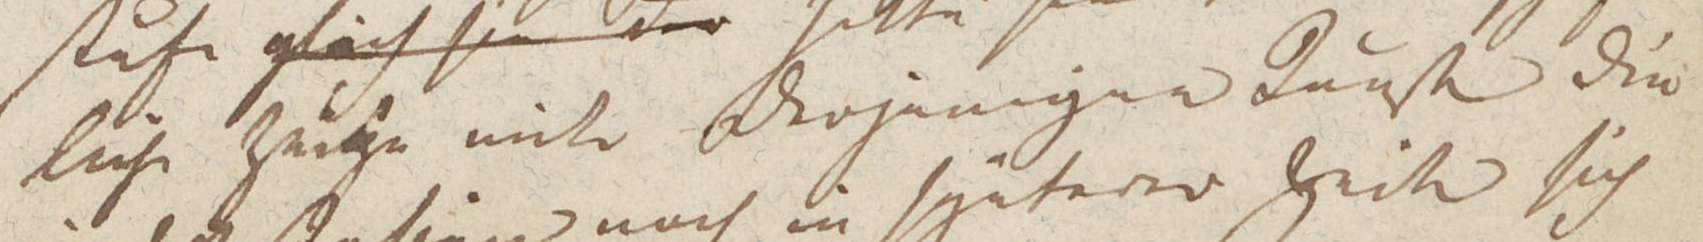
liche Züge mit derjenigen Kunst die
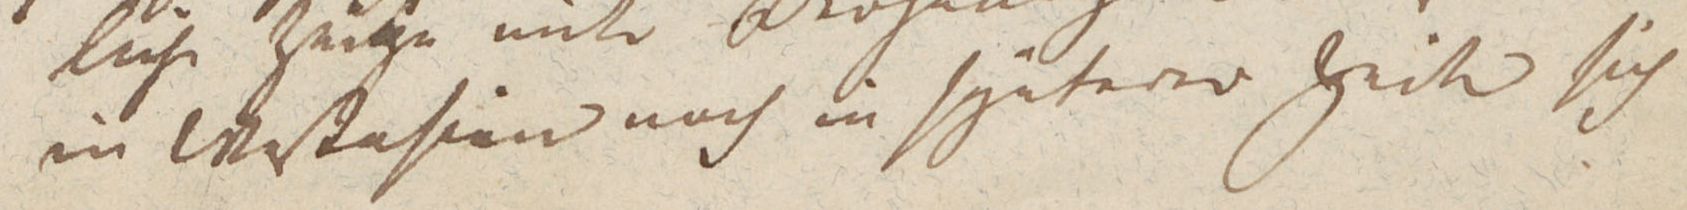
in Westasien noch in späterer Zeit sich
